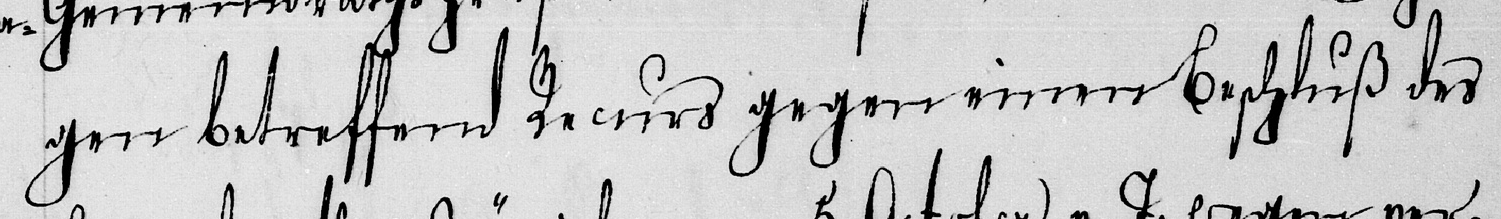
gen betreffend Recurs gegen einen Beschluß des
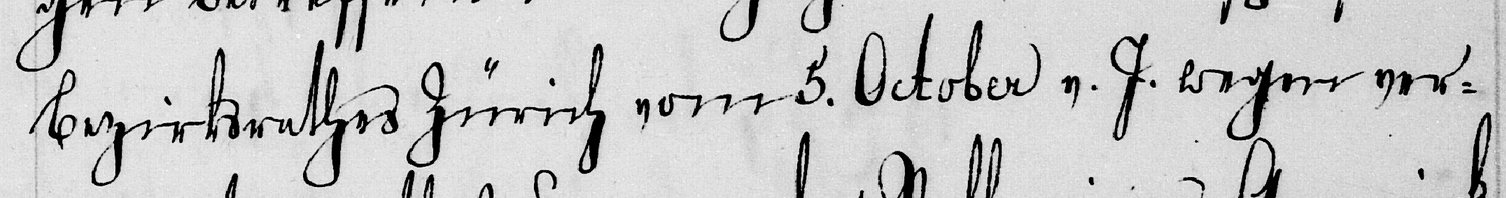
Bezirksrathes Zürich vom 5. October v. J. wegen ver¬
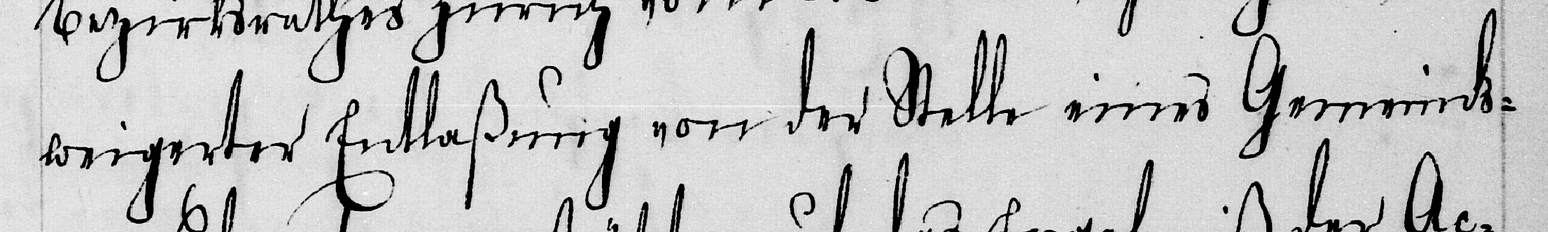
weigerter Entlaßung von der Stelle eines Gemeinds¬
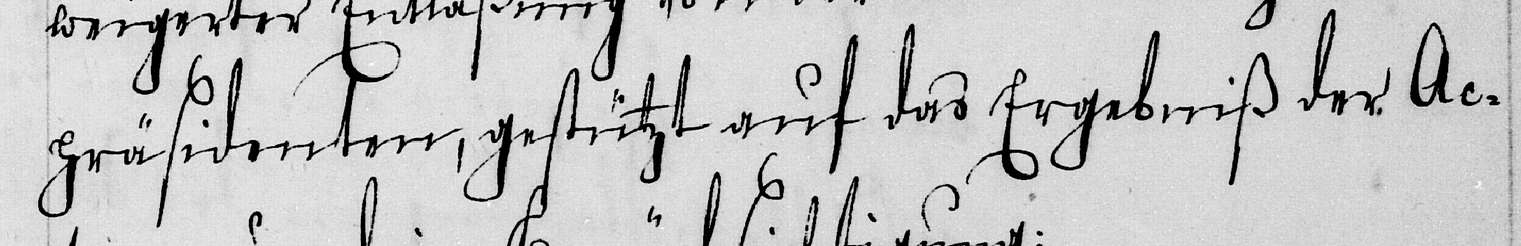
präsidenten, gestützt auf das Ergebniß der Ac¬
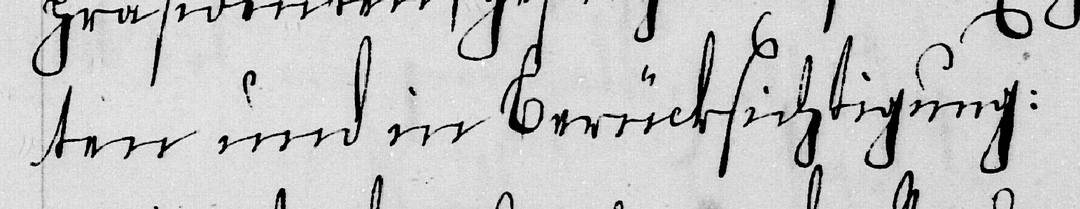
ten und in Berücksichtugung:
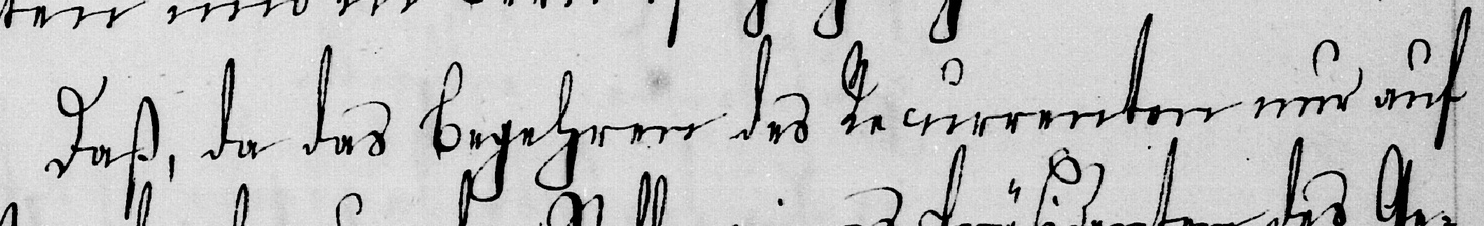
Daß, da das Begehren des Recurrenten nur auf
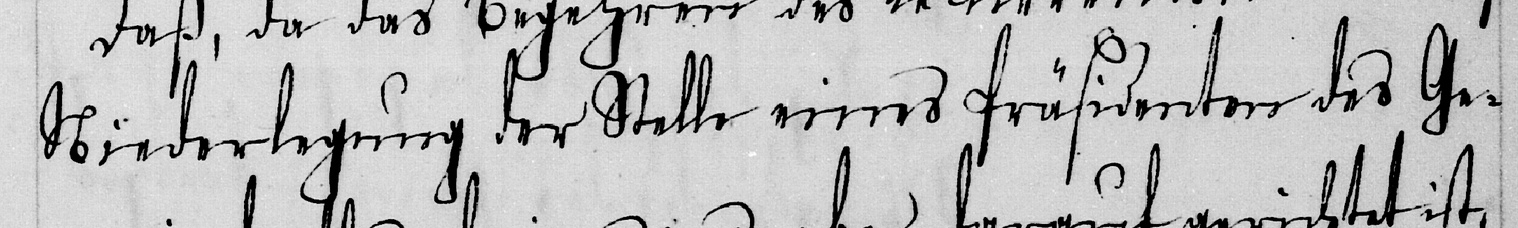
Niederlegung der Stelle eines Präsidenten des Ge¬
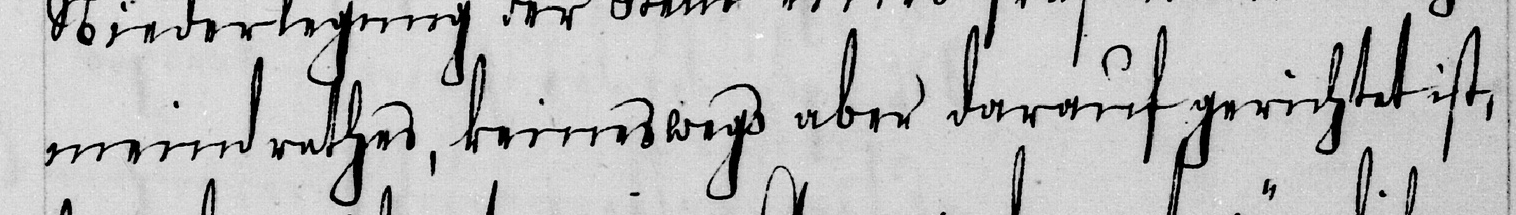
meindrathes, keineswegs aber darauf gerichtet ist,
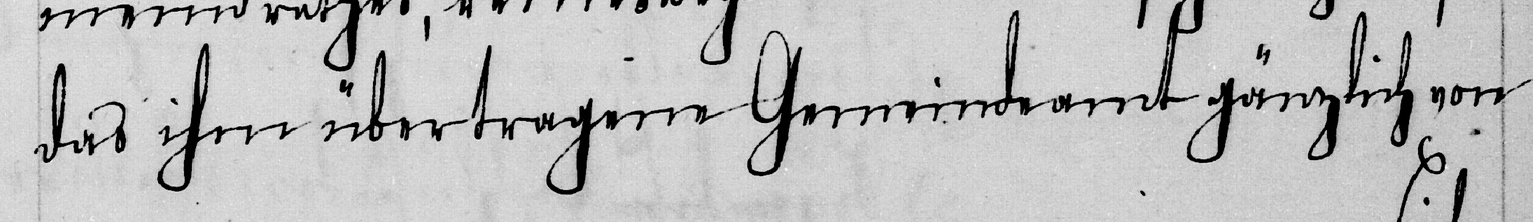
das ihm übertragene Gemeindeamt gänzlich von
